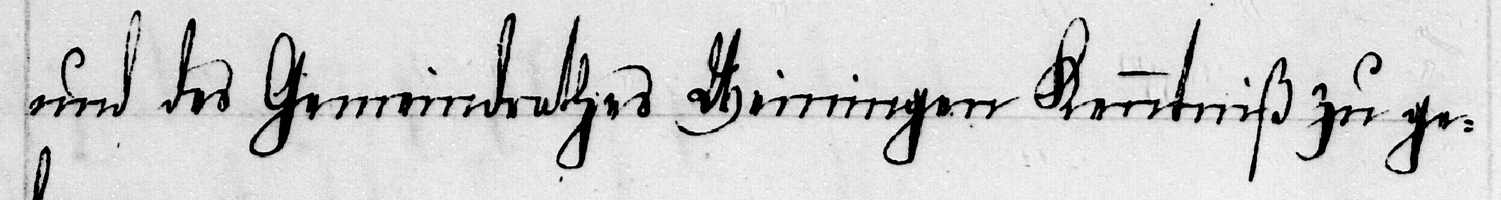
und des Gemeindrathes Weiningen Kenntniß zu ge¬
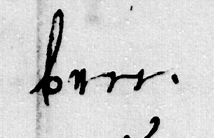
ben.
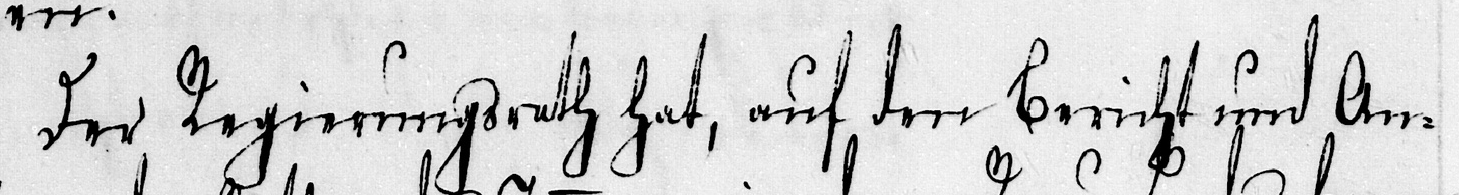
Der Regierungsrath hat, auf den Bericht und An¬
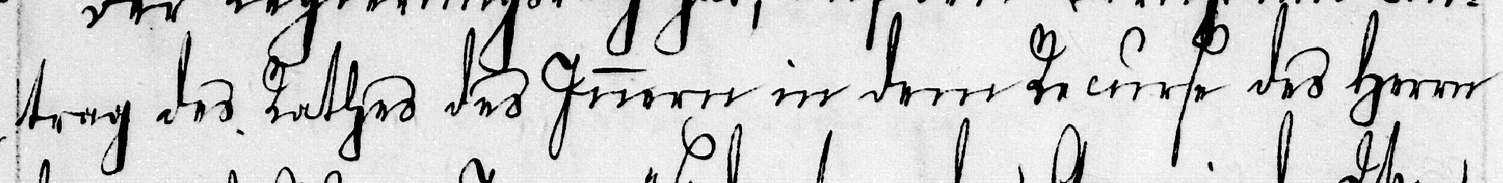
trag des Rathes des Innern in dem Recurse des Herrn
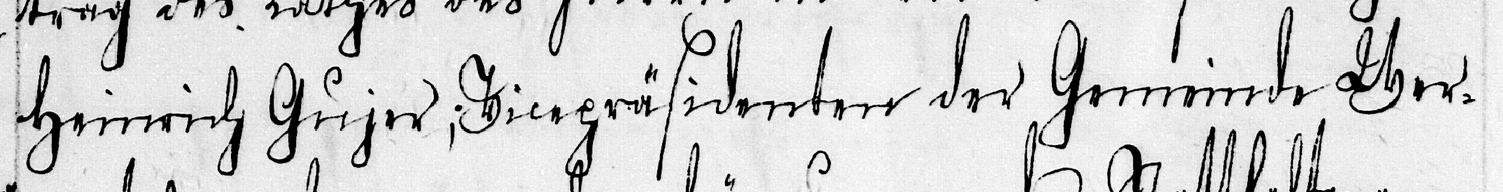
Heinrich Gujer; Vicepräsidenten der Gemeinde Wer¬
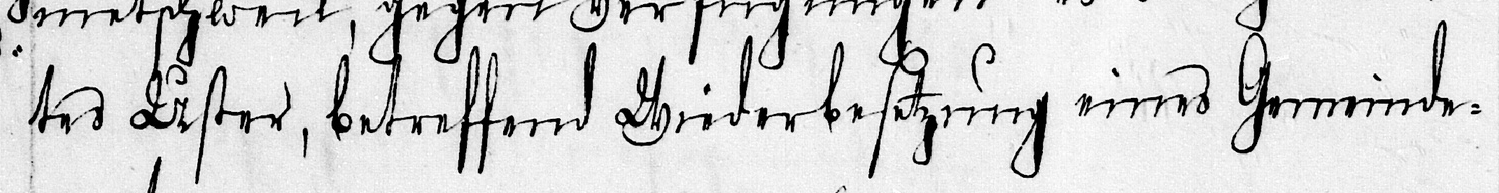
tes Uster, betreffend Wiederbesetzung eines Gemeinde¬
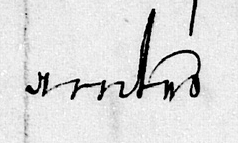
amtes
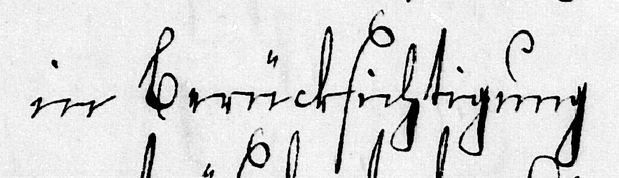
in Berücksichtigung
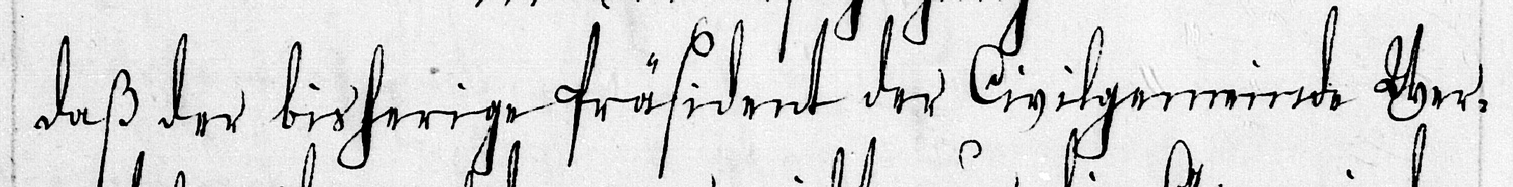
daß der bisherige Präsident der Civilgemeinde Wer¬
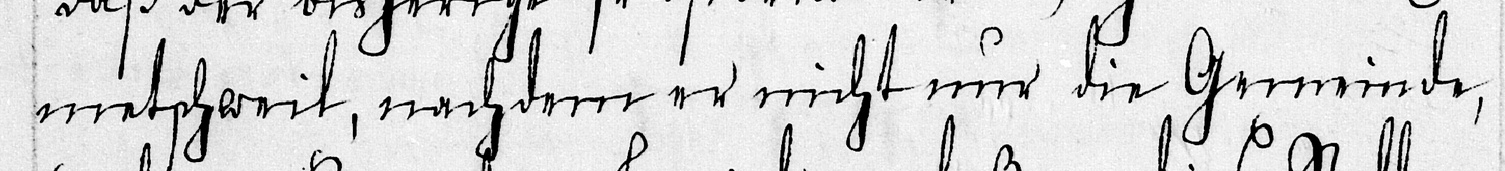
metschweil, nachdem er nicht nur die Gemeinde,
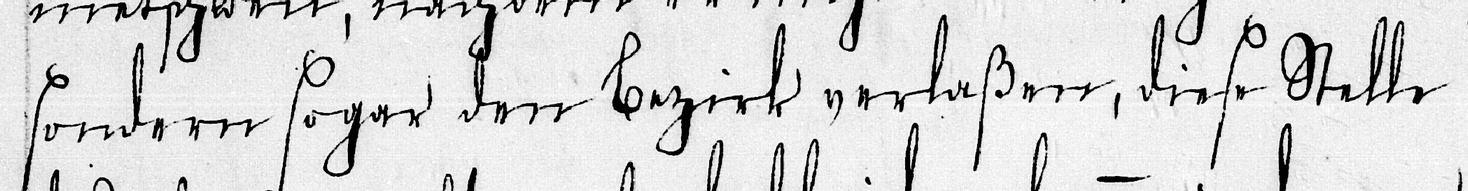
sondern sogar den Bezirk verlaßen, diese Stelle
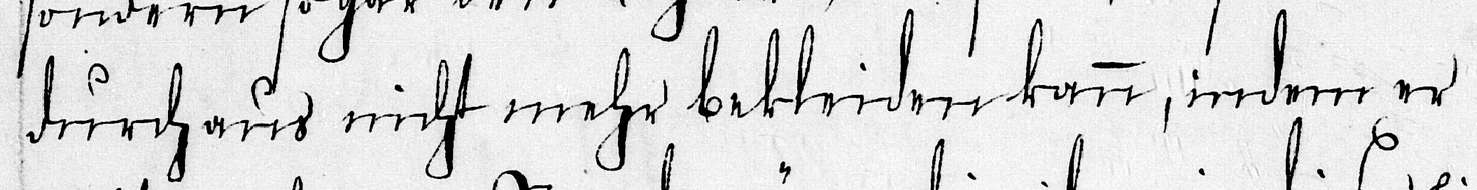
durchaus nicht mehr bekleiden kann, indem er
